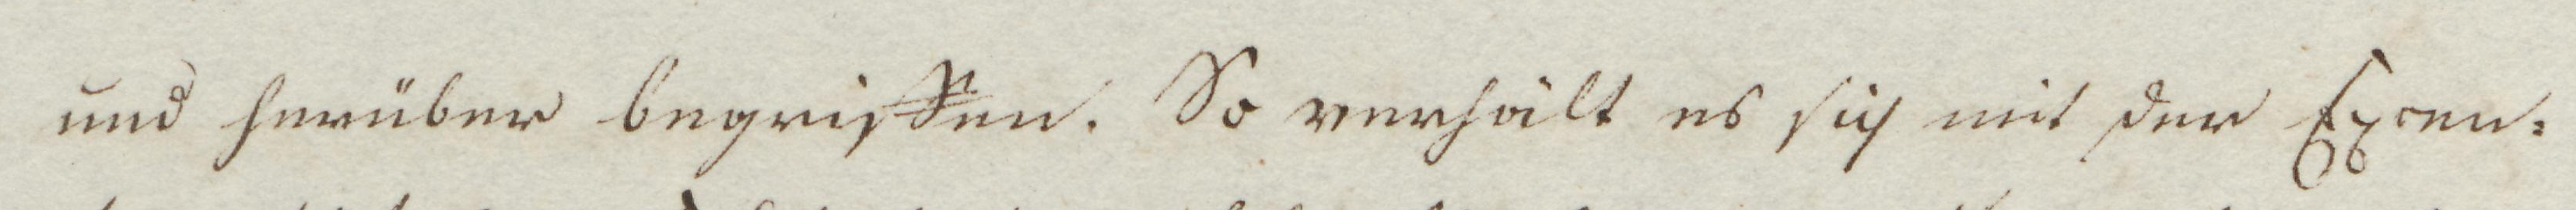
und herüber begriffen. So verhält es sich mit der Excen-
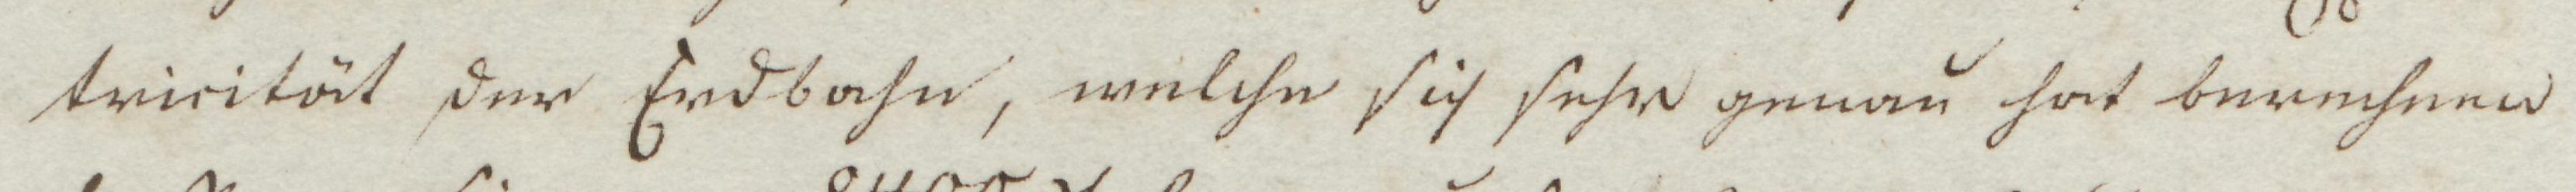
tricität der Erdbahn, welche sich sehr genau hat berechnen
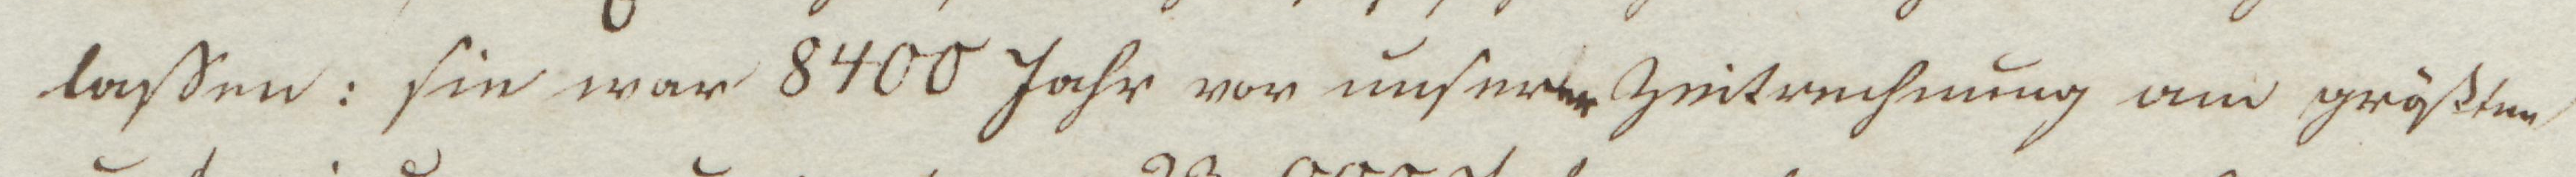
lassen: sie war 8400 Jahr vor unserer Zeitrechnung am größten
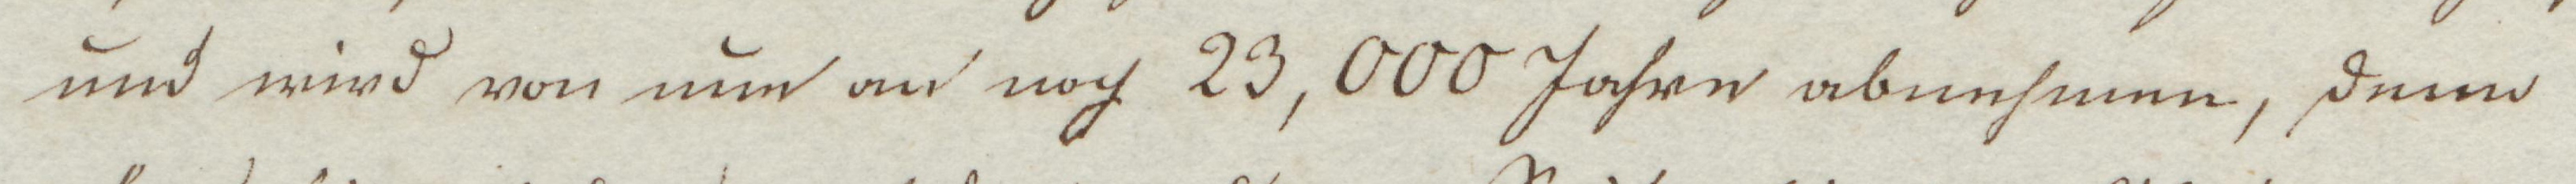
und wird von nun an noch 23,000 Jahre abnehmen, denn
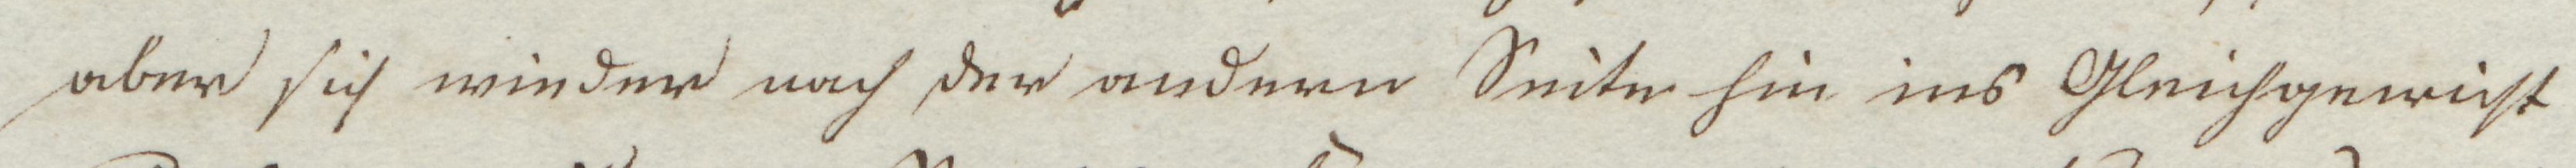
aber sich wieder nach der andern Seite hin ins Gleichgewicht
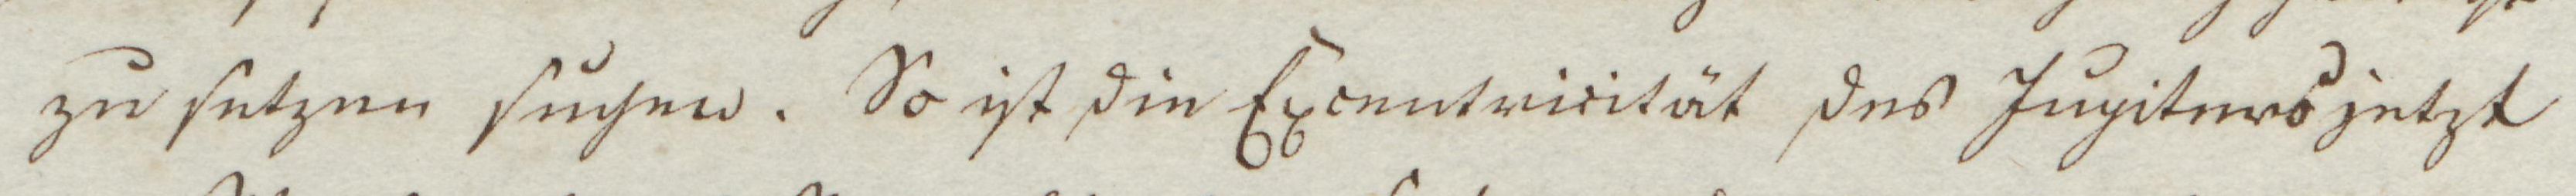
zu setzen suchen. So ist die Excentricität des Jupiters jetzt
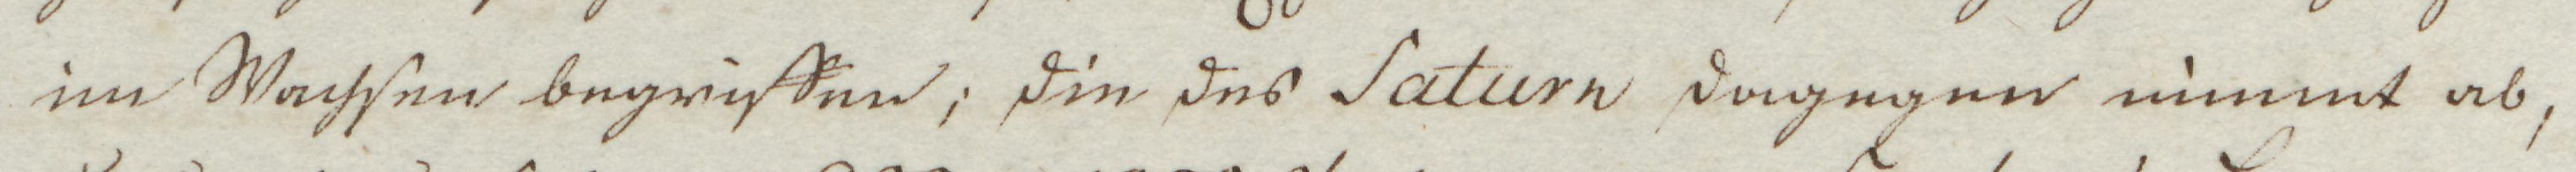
im Wachsen begriffen; die des Saturn dagegen nimmt ab,
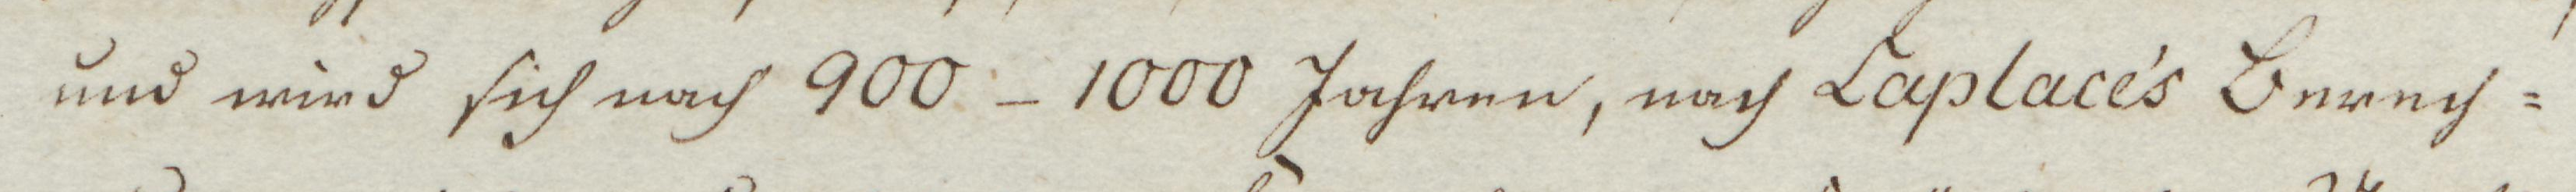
und wird sich nach 900–1000 Jahren, nach Laplace's Berech-
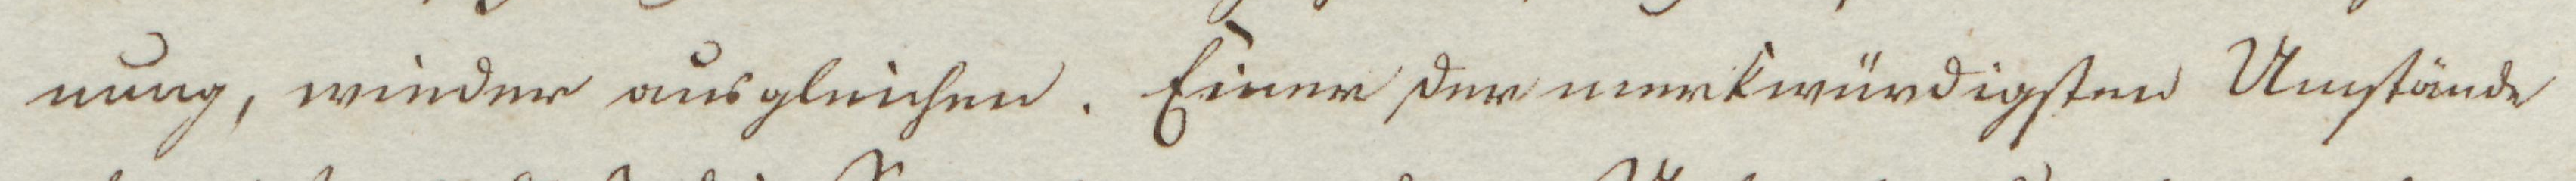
nung, wieder ausgleichen. Einer der merkwürdigsten Umstände
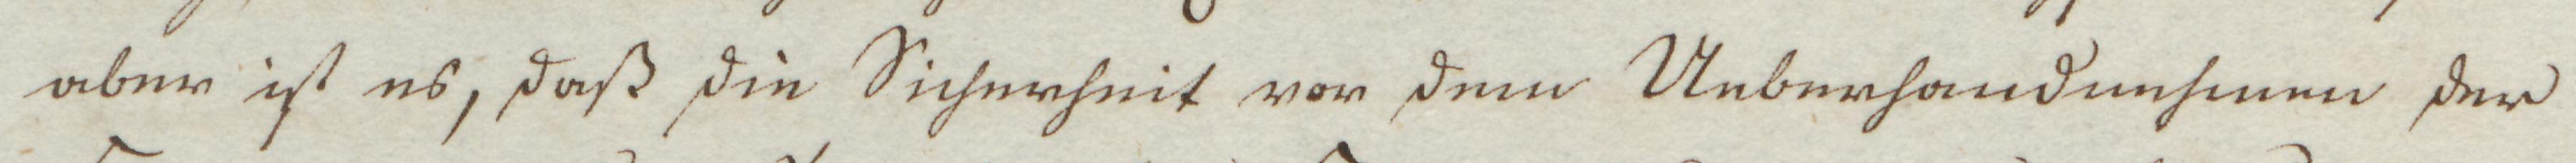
aber ist es, daß die Sicherheit von dem Ueberhandnehmen der
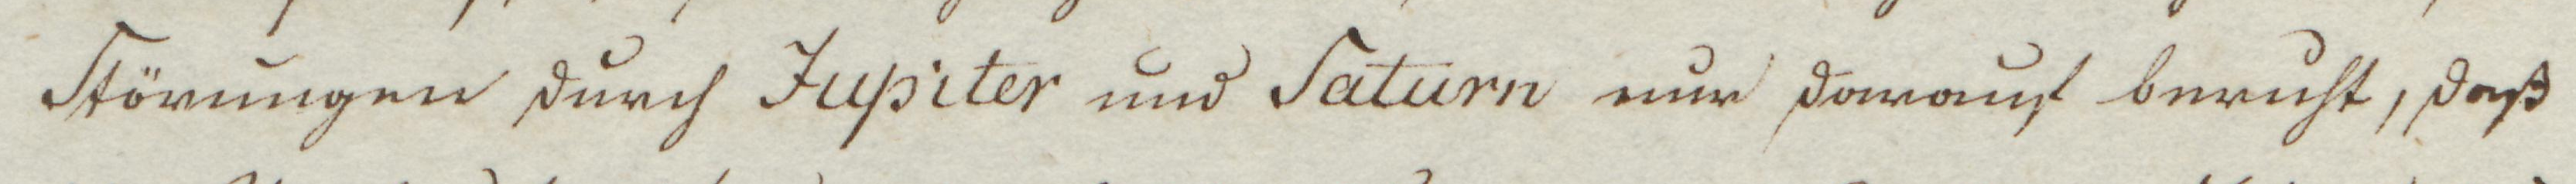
Störungen durch Jupiter und Saturn nur darauf beruht, daß
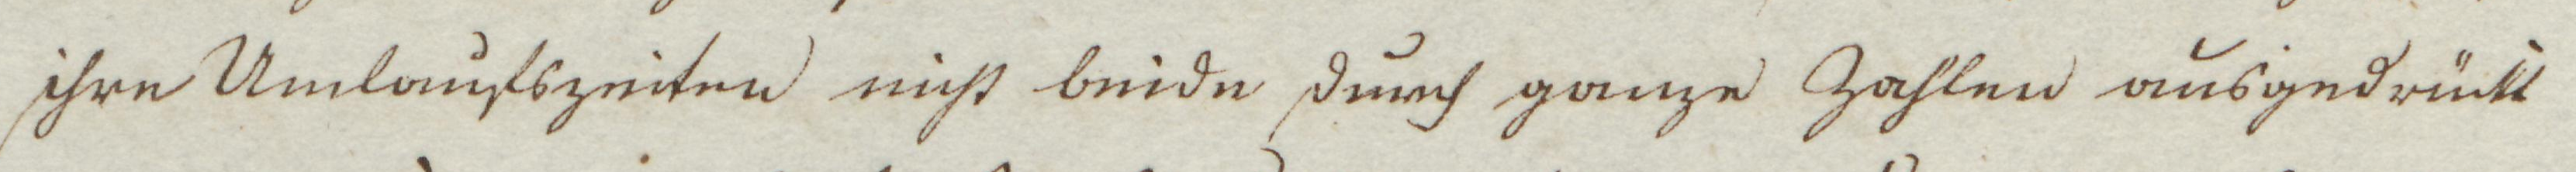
ihre Umlaufszeiten nicht beide durch ganze Zahlen ausgedrückt
